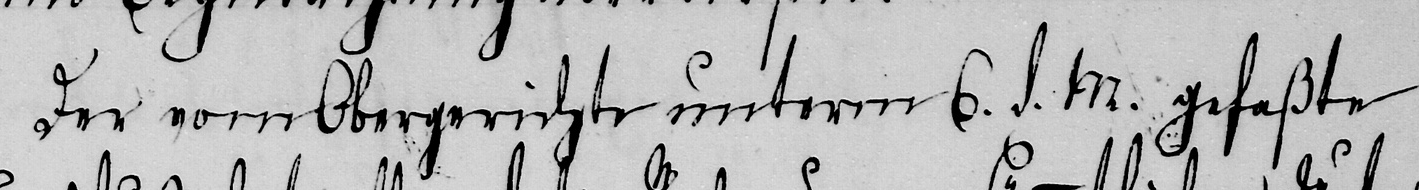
Der vom Obergerichte unterm 6. d. M. gefaßte
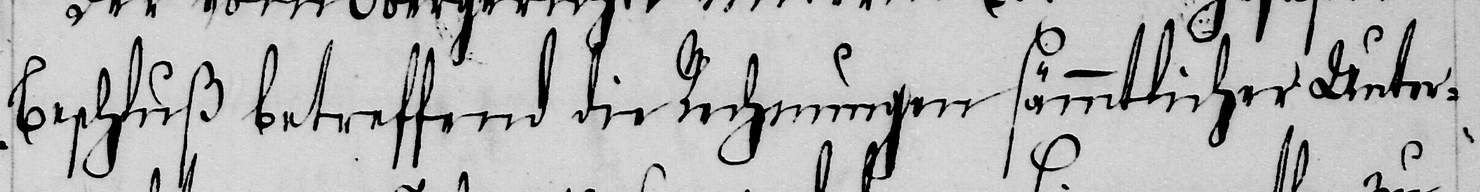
Beschluß betreffend die Rechnungen sämmtlicher Unter¬
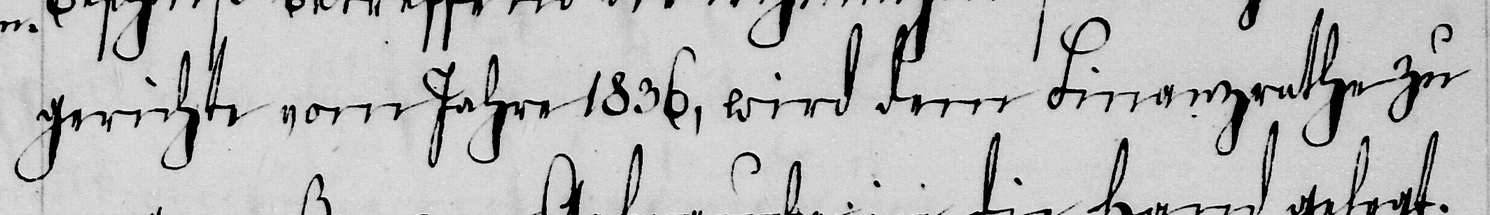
gerichte vom Jahre 1836, wird dem Finanzrathe zu
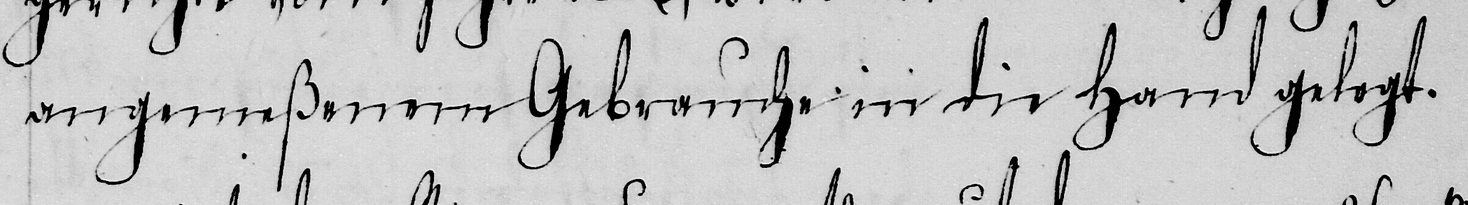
angemeßenem Gebrauche in die Hand gelegt.
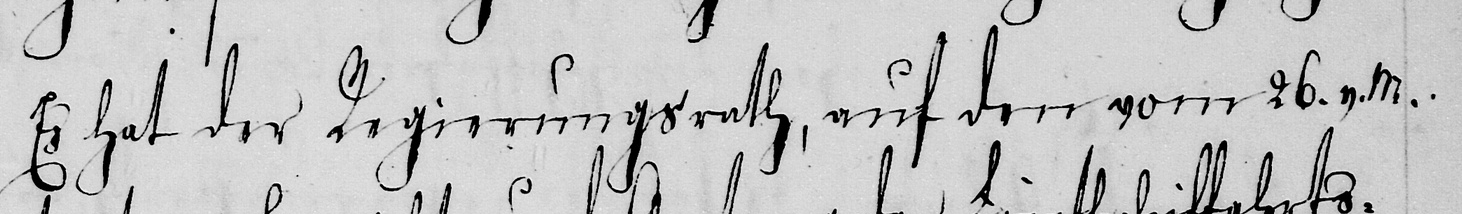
Es hat der Regierungsrath, auf den vom 26. v. M.
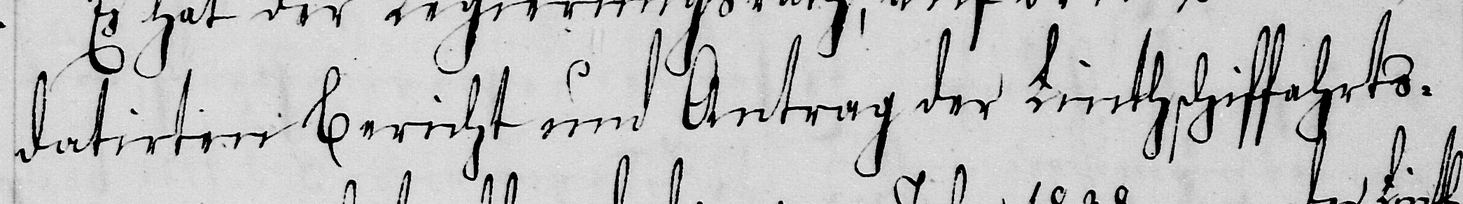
datirten Bericht und Antrag der Linthschiffahrts-C¬
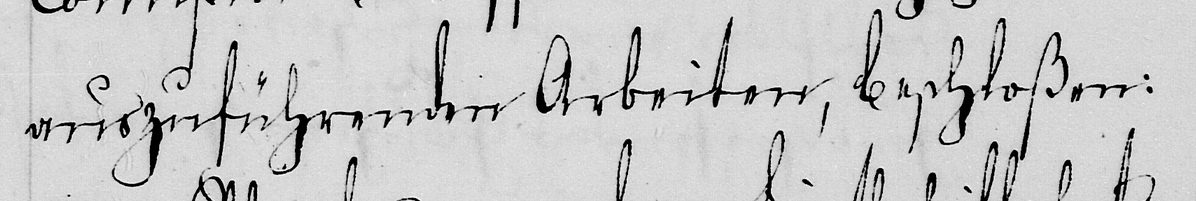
auszuführenden Arbeiten, beschloßen:
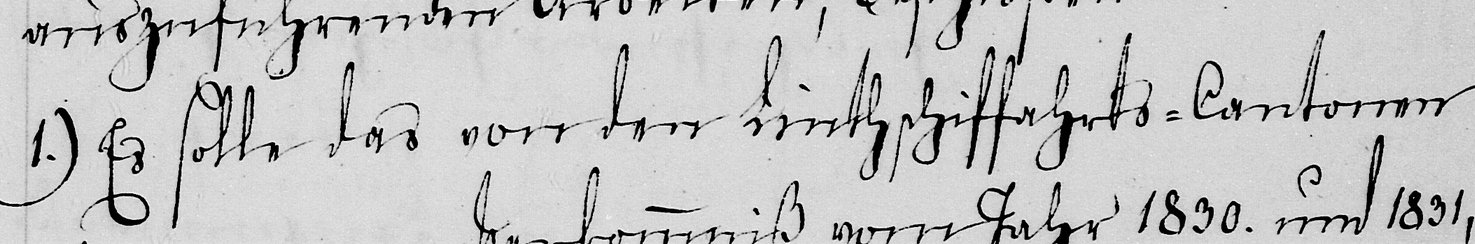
1.) Es solle das von den Linthschiffahrts-Cantonen
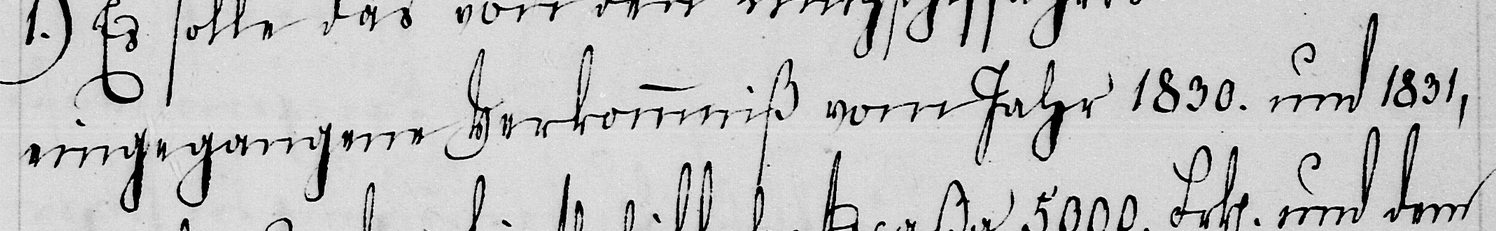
eingezogene Verkommniß vom Jahr 1830. und 1831,
